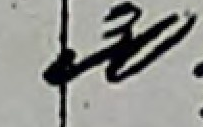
30
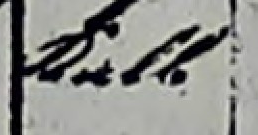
1 Kalb
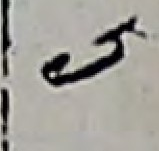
5
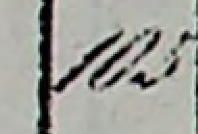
105
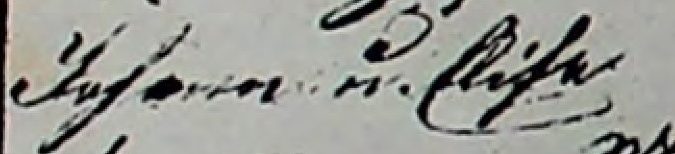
Johann u. Elise
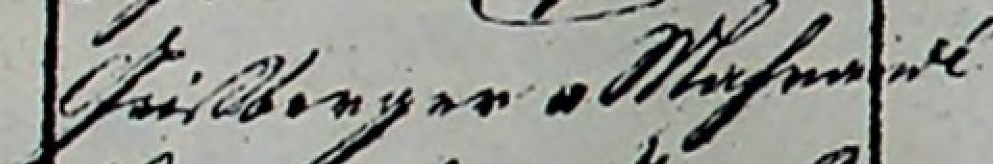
Geisberger v. Mahra??l
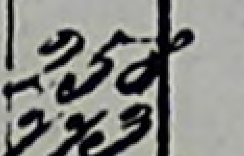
258
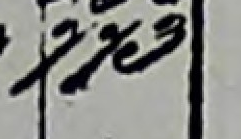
773
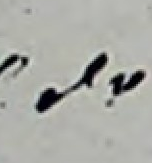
do
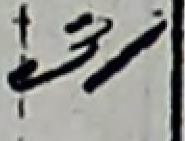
31
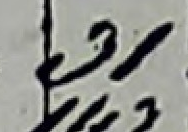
31
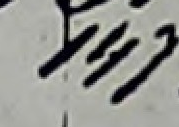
147
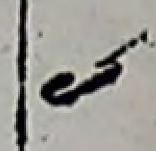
5
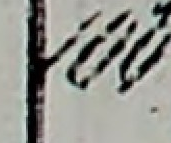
106
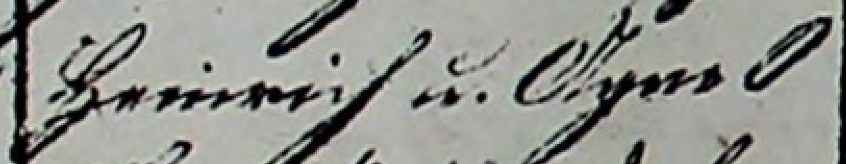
Heinrich u. Agnes
